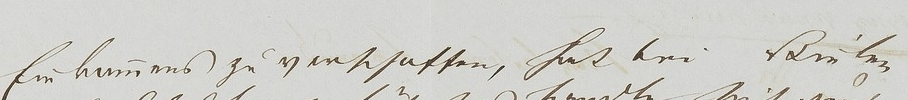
Einkommens zu verschaffen, hat bei Vielen
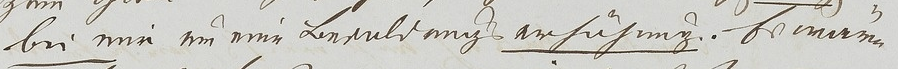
bei mir um eine Besoldungserhöhung. Es wäre
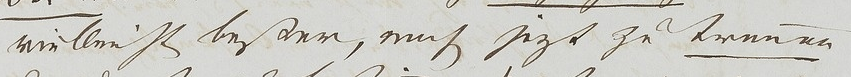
vielleicht besser, noch jezt zu trennen
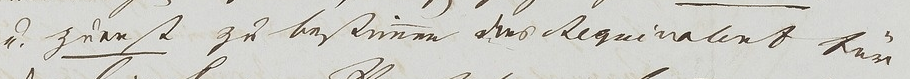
u. zuerst zu bestimmen das Aequivalent für
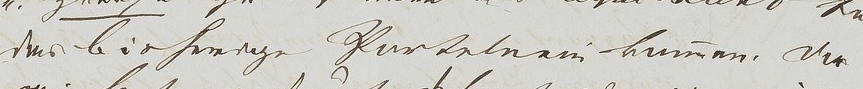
das bisherige Sportelneinkommen. Da
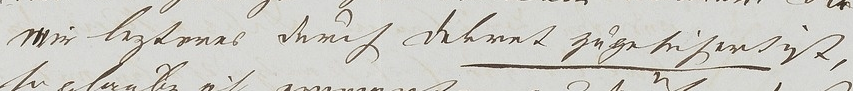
mir lezteres durch Dekret zugesichert ist,
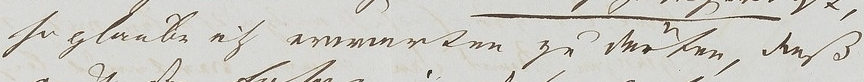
so glaube ich erwarten zu dürfen, daß
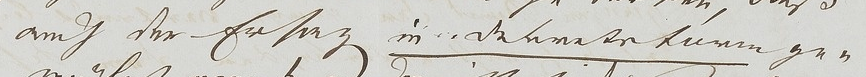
auch der Ersaz in Dekretsform ge-
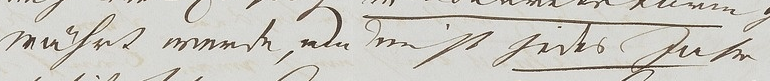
währt werde, um nicht jedes Jahr
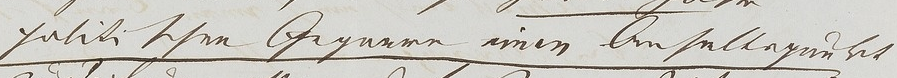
politischen Gegnern einen Anhaltspunkt
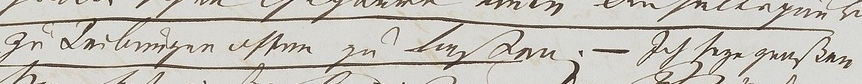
zu Reibungen offen zu lassen. – Ich seze großen
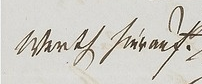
Werth hierauf.
